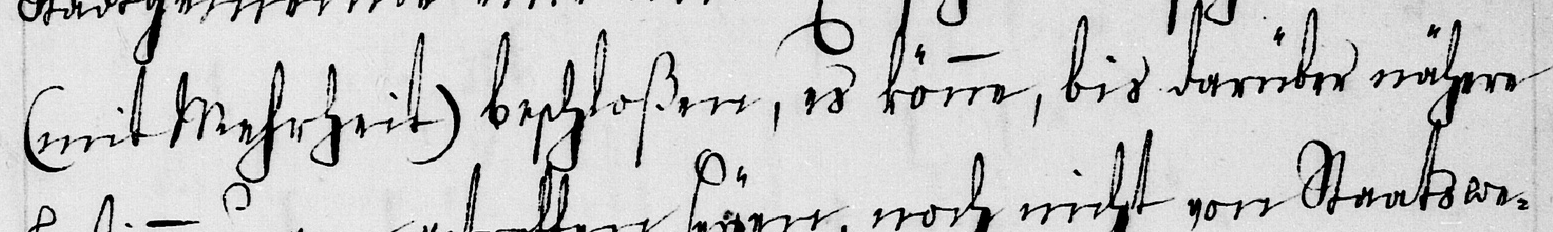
(mit Mehrheit) beschloßen, es könne, bis darüber nähere
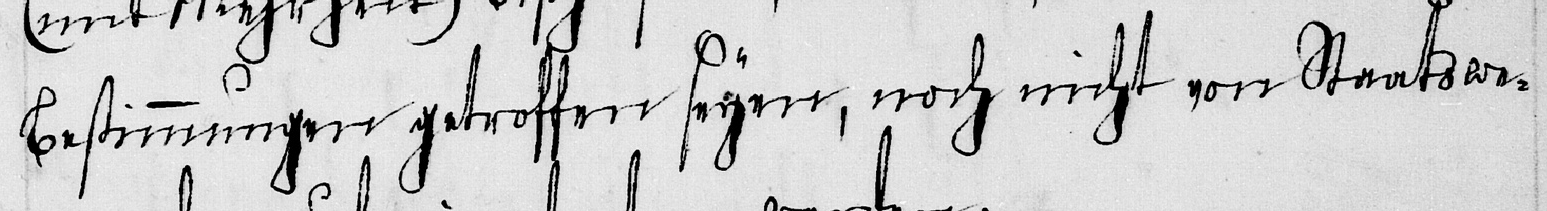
Bestimmungen getroffen seyen, noch nicht von Staatswe¬
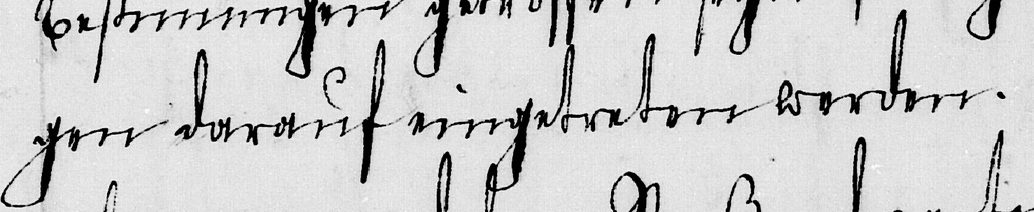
gen darauf eingetreten werden.
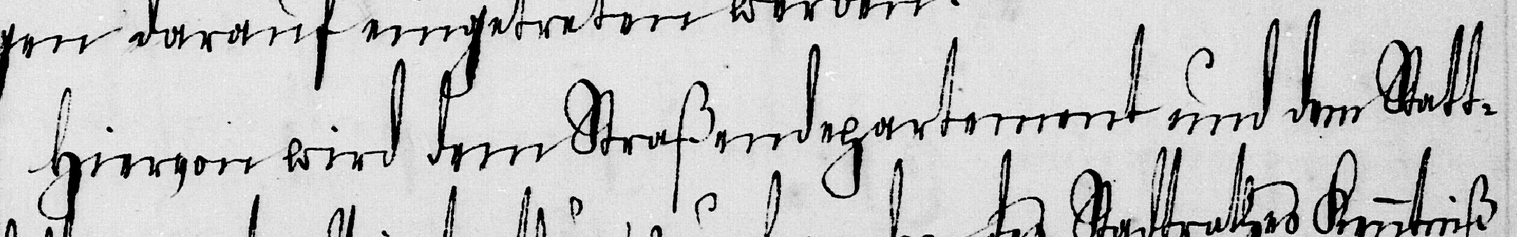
Hiervon wird dem Straßendepartement und dem Stat¬
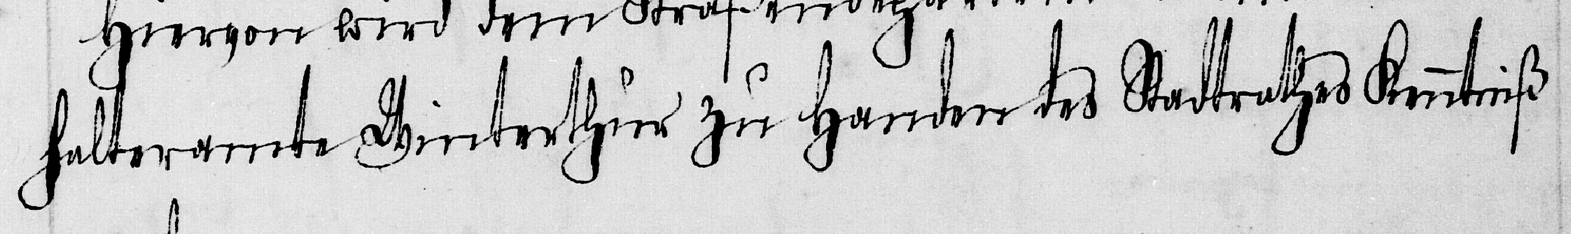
thalteramte Winterthur zu Handen des Stadtrathes Kenntniß
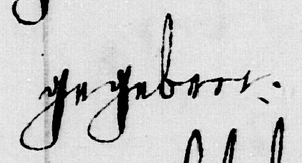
gegeben.
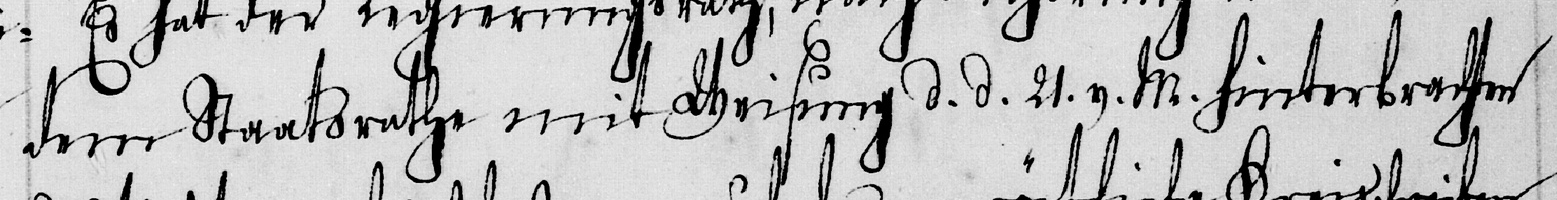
dem Staatsrathe mit Weisung d. d. 21. v. M. hinterbrachten
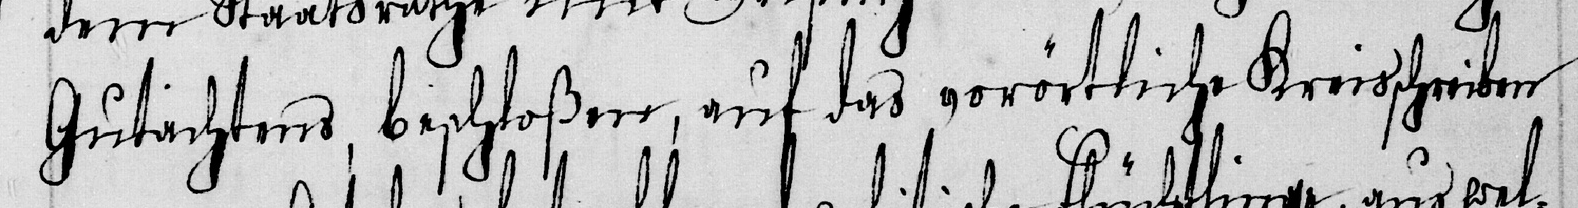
Gutachtens, beschloßen, auf das vorörtliche Kreisschreiben
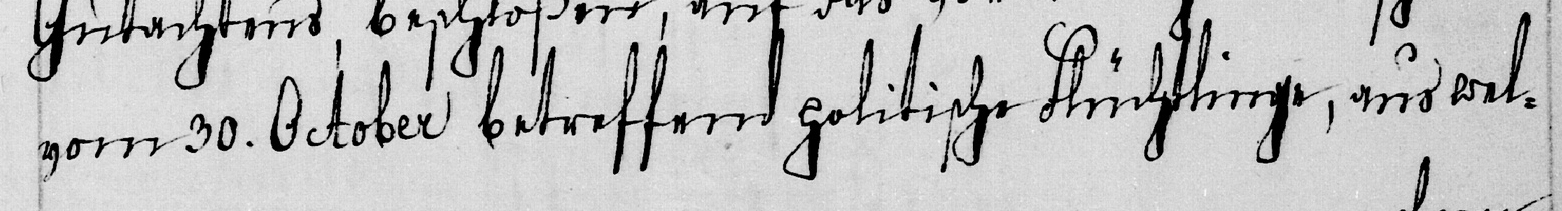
vom 30. October betreffend politische Flüchtlinge, aus wel-
